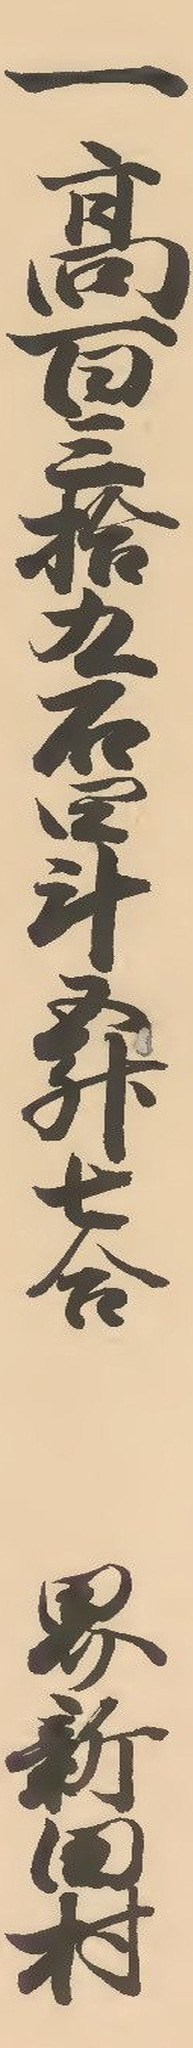一高百三拾九石四斗五升七合界新田村
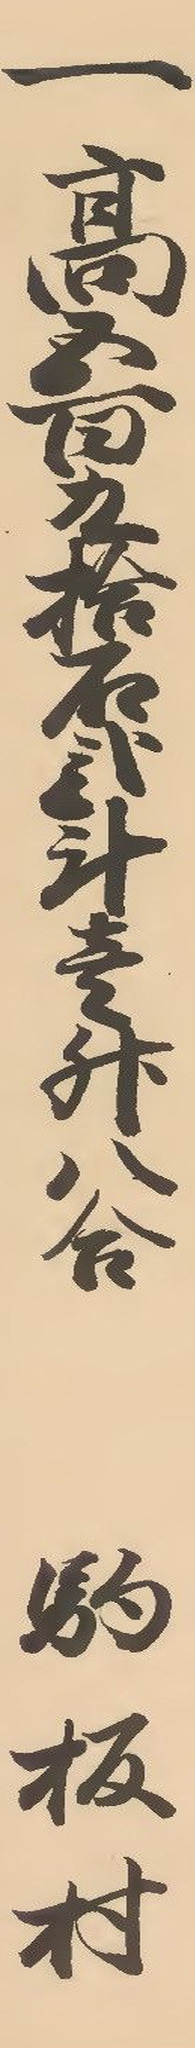一高五百九拾石弐斗壱升八合駒板村
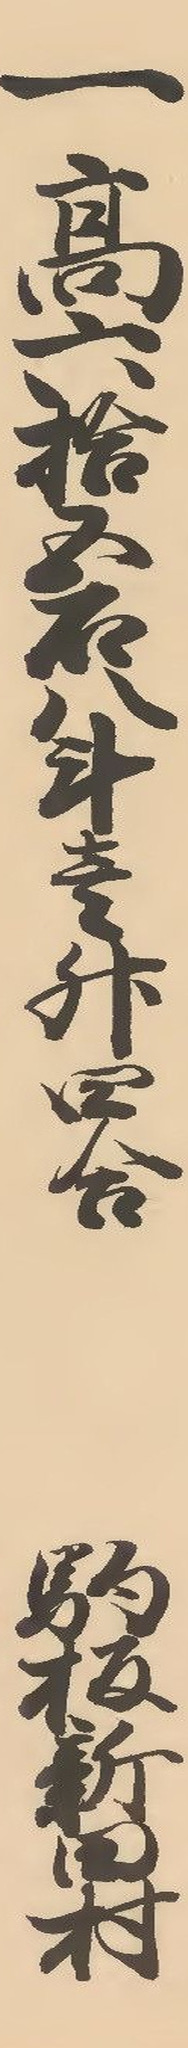一高六拾五石八斗壱升四合駒板新田村
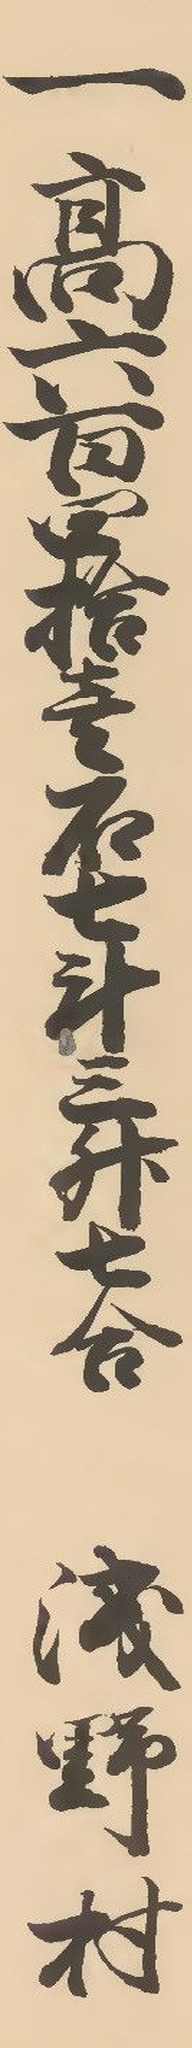一高六百四拾壱石七斗三升七合浅野村
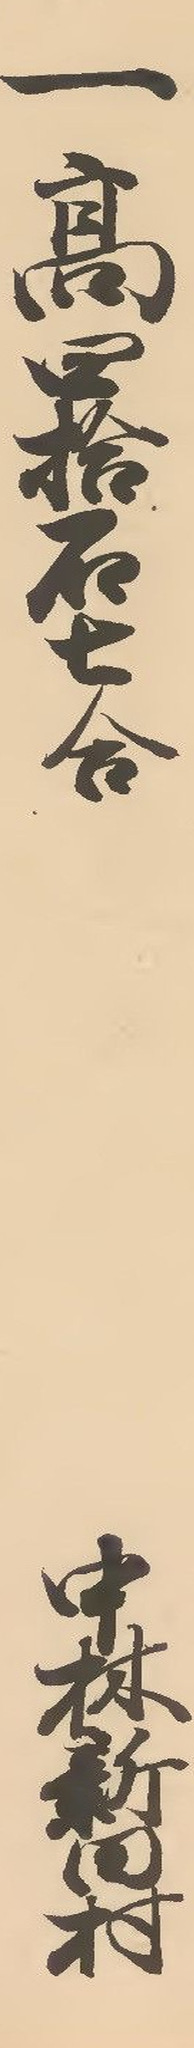一高四拾石七合中林新田村
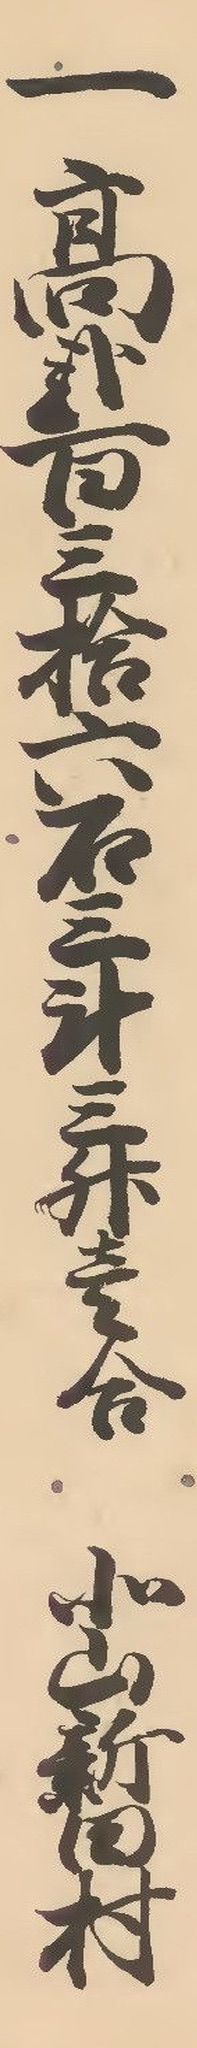一高弐百三拾六石三斗三升壱合北山新田村

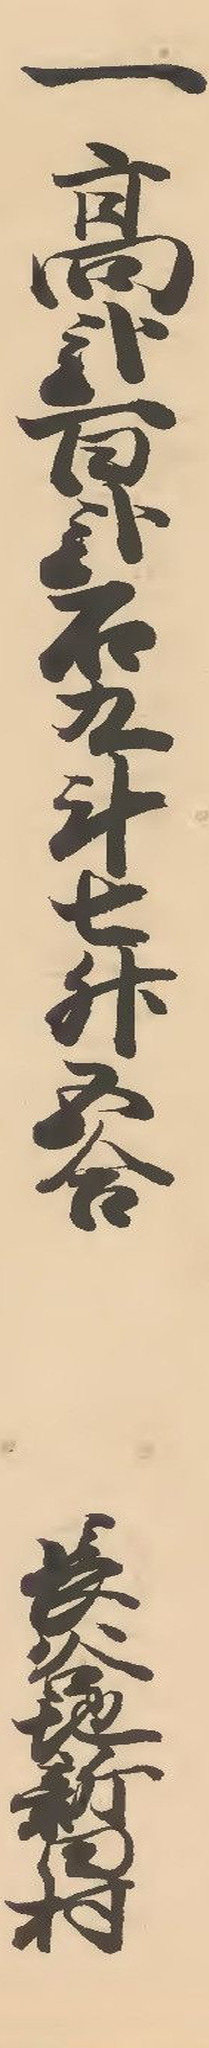一高弐百弐石九斗七升五合長谷地新田村
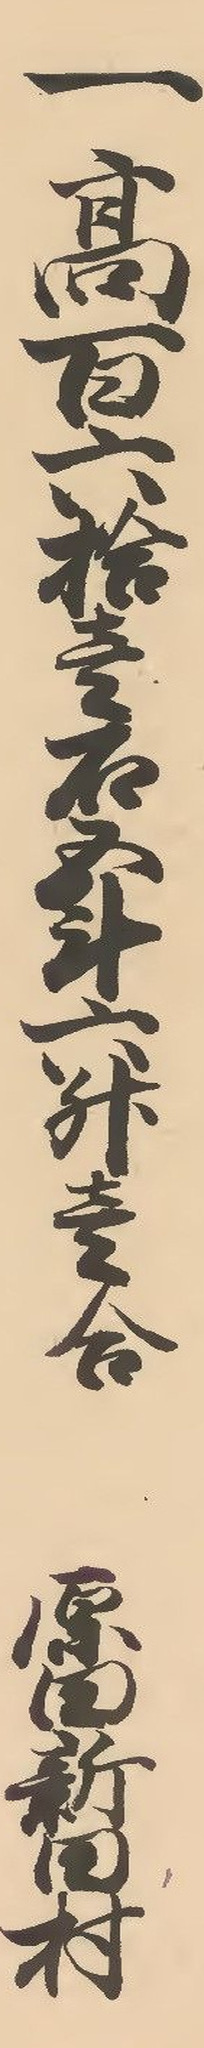一高百六拾壱石五斗六升壱合原田新田村
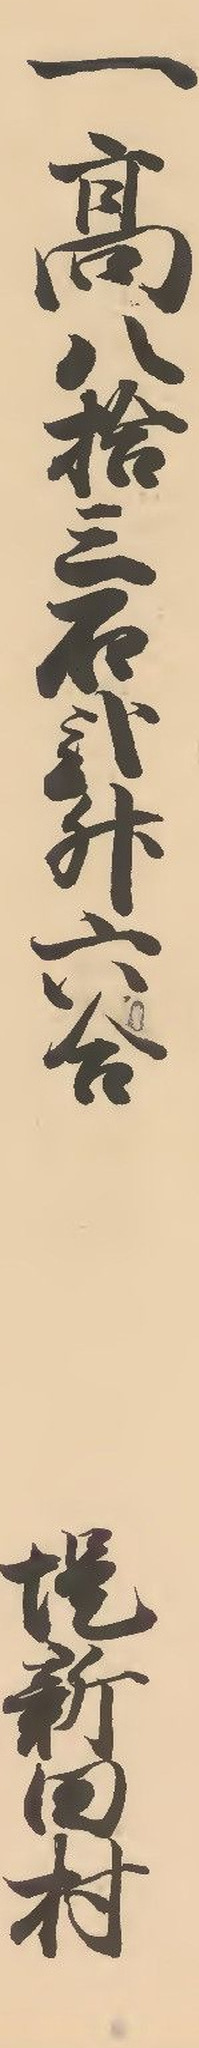一高八拾三石弐升六合堤新田村
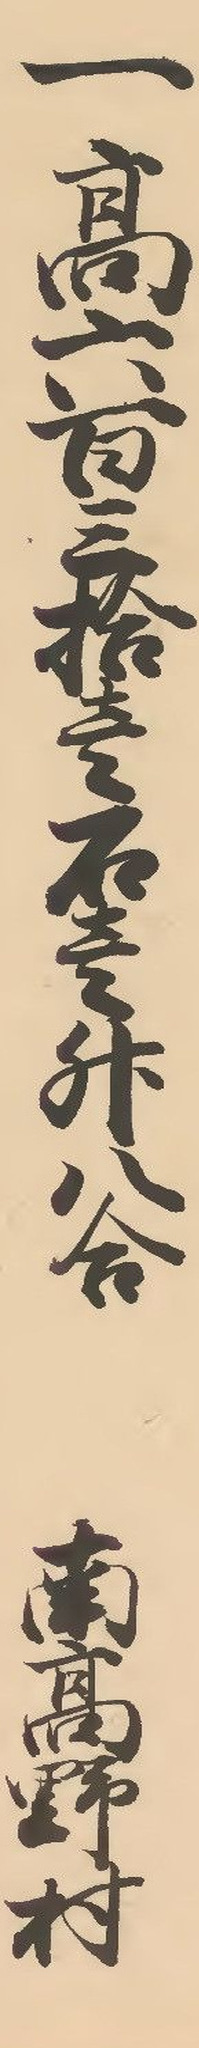一高六百三拾壱石壱升八合南高野村
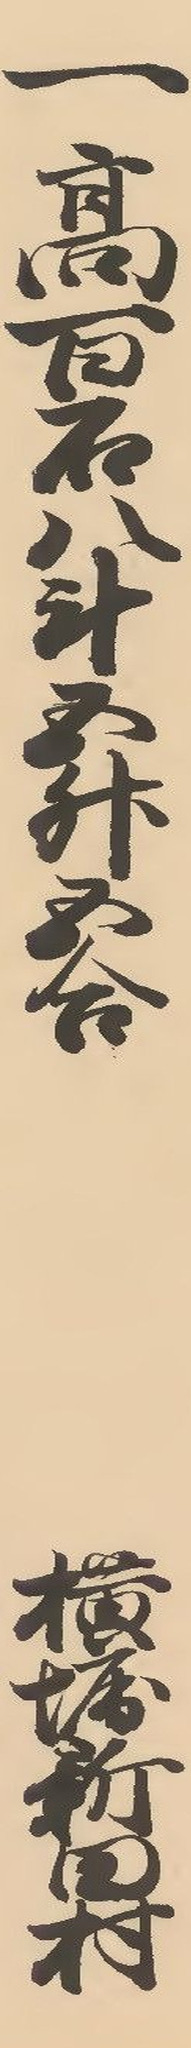一高百石八斗五升五合横堀新田村
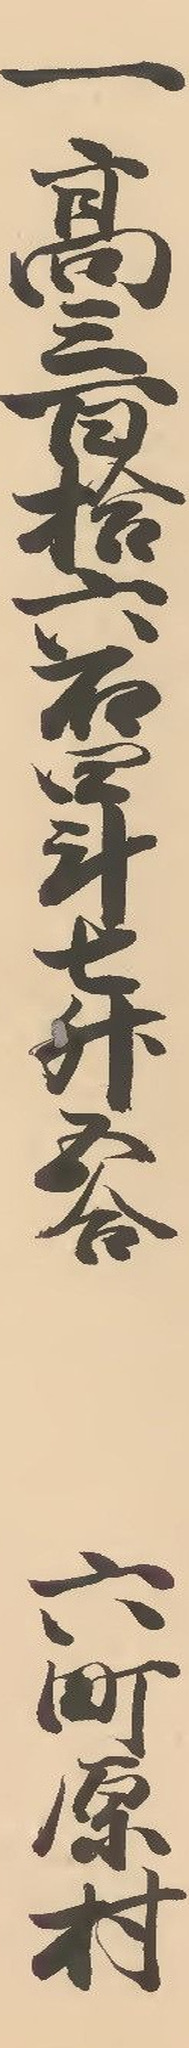一高三百拾六石四斗七升五合六町原村
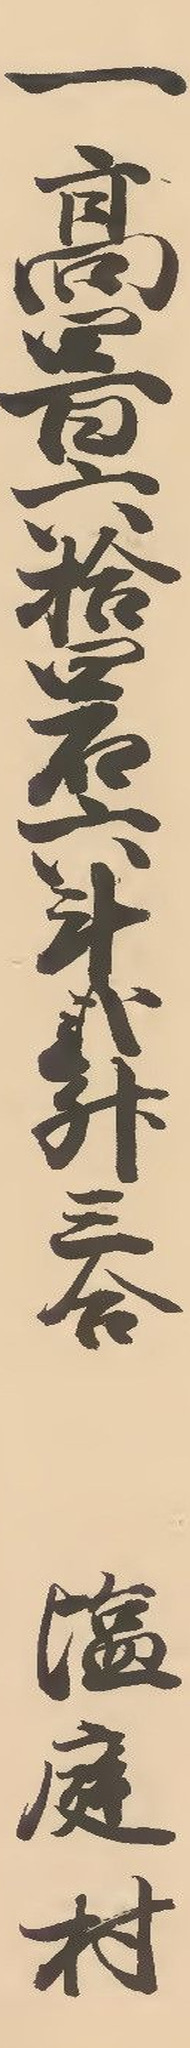一高四百六拾四石六斗弐升三合塩庭村
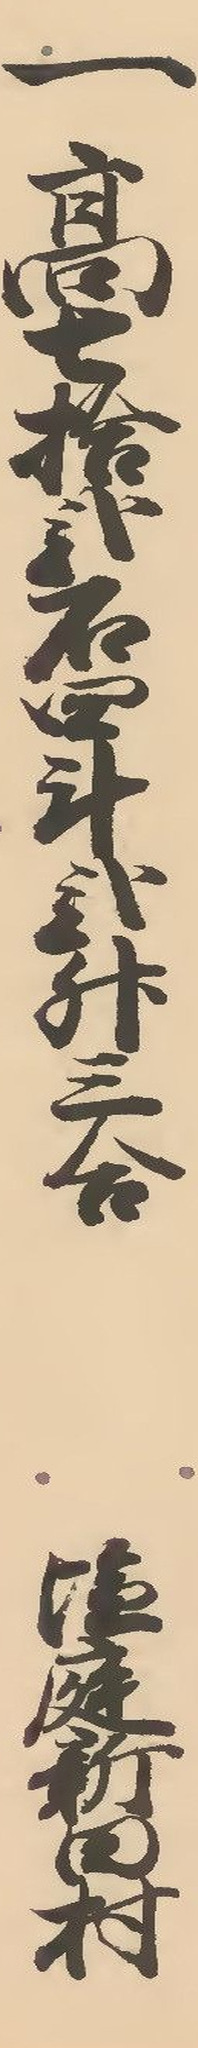一高七拾弐石四斗弐升三合塩庭新田村

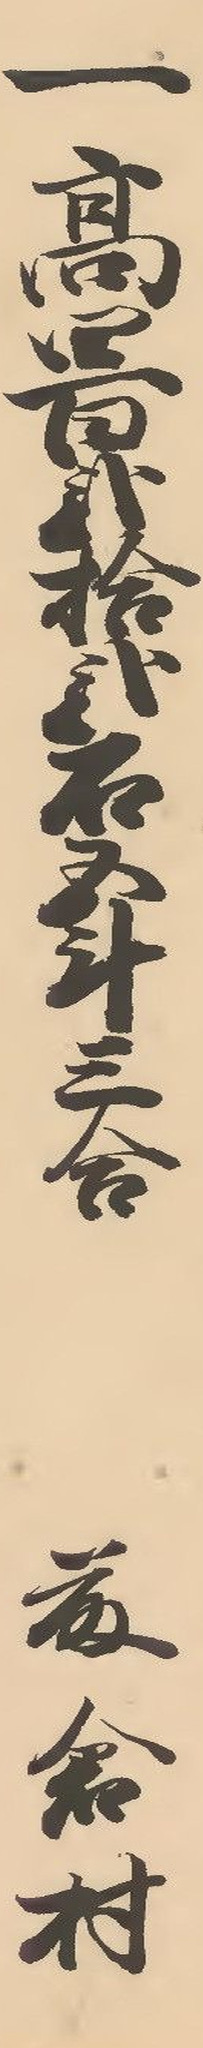一高四百弐拾弐石五斗三合藤倉村
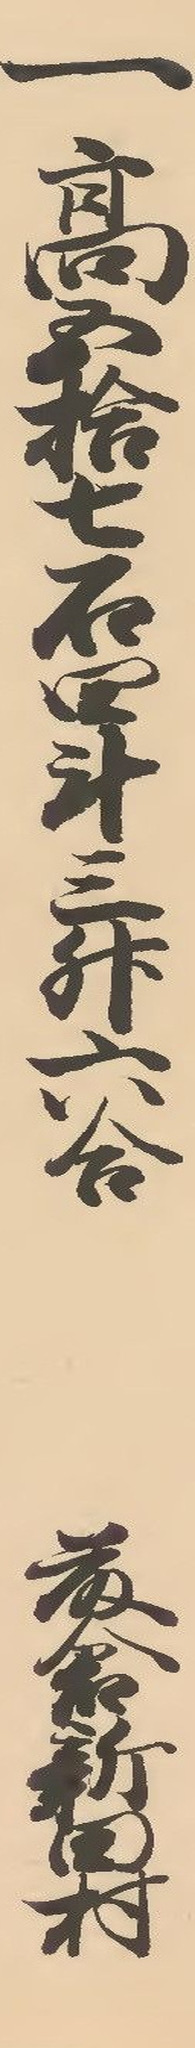一高五拾七石四斗三升六合藤倉新田村
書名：陸奥国郷帳　１
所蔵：国立公文書館 National Archives of Japan
